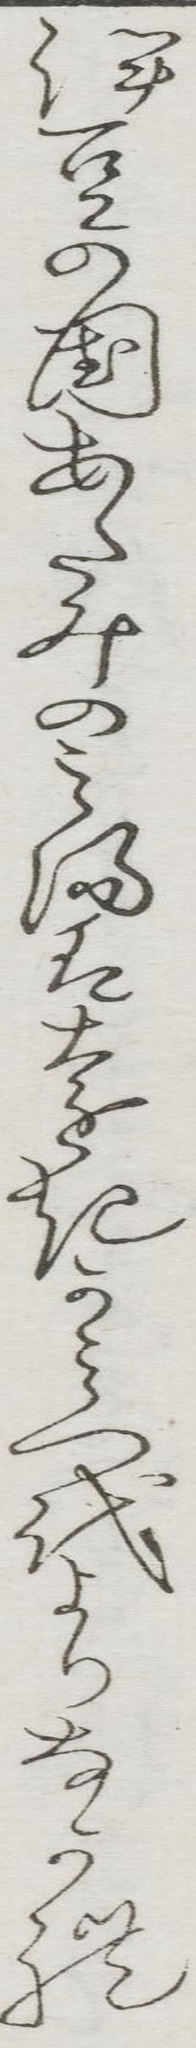伊豆の国あたみのみ湯は遠きかみつ代よりなかれ
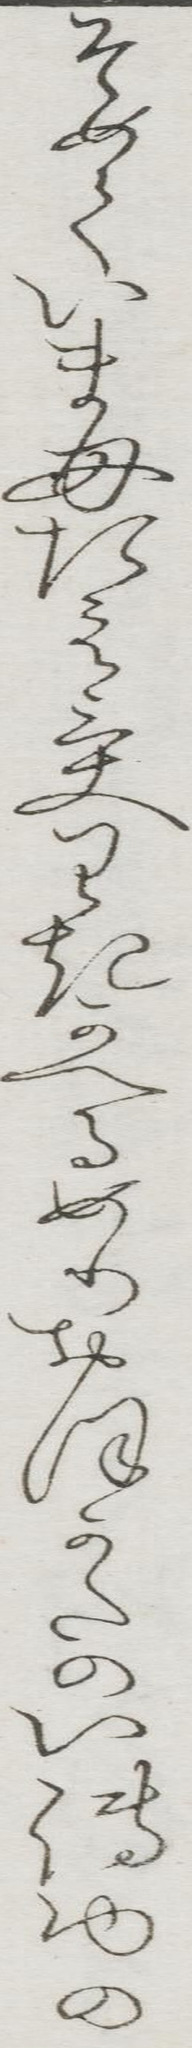そめていまもたえすわきかへるめりおほかたのいてゆの
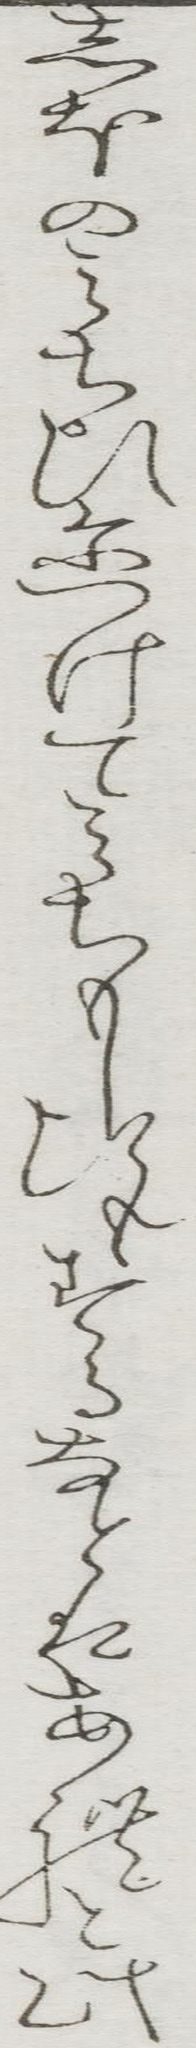しほのみちひにつけてみちもひもするなとはあれと此
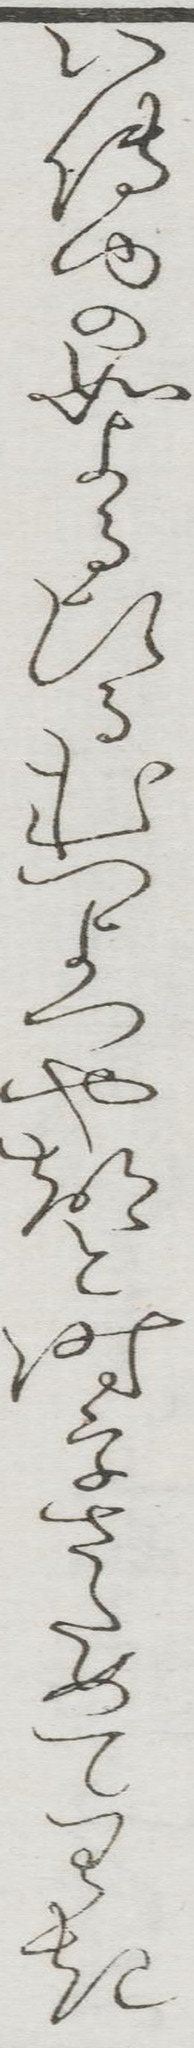いてゆの如よるひるむつよつやつと時をさためてわき
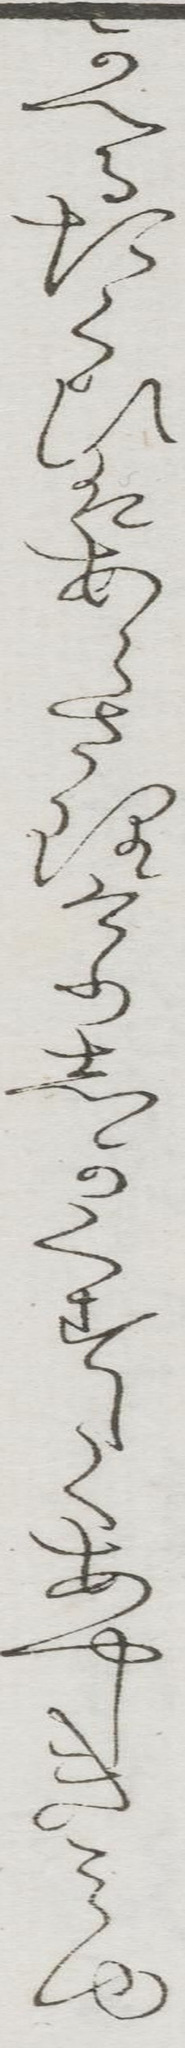かへるたくひはあらさりけりしかくすしくあやしきみゆ
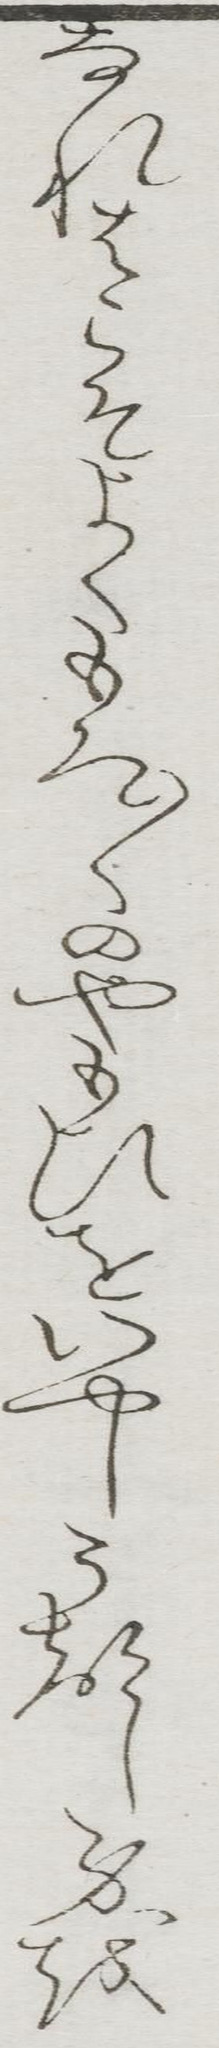なれはこそよくもろ〳〵のやもひをいやしうつし身を
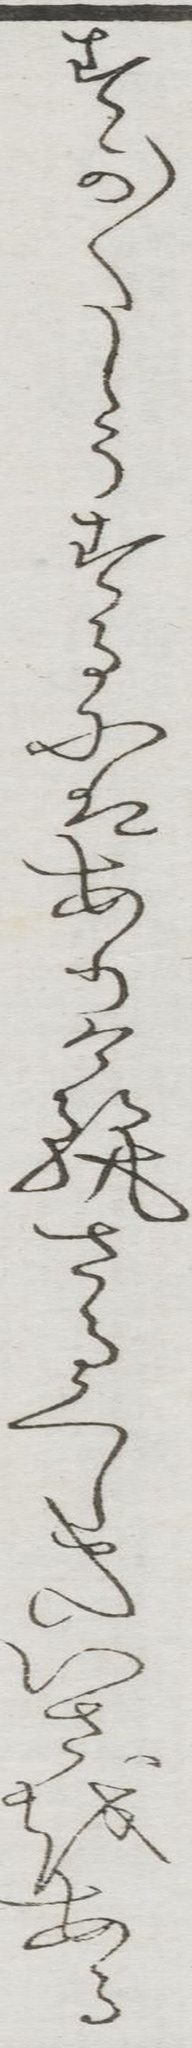すか〳〵しうするにはありけれさるくしきいさをある
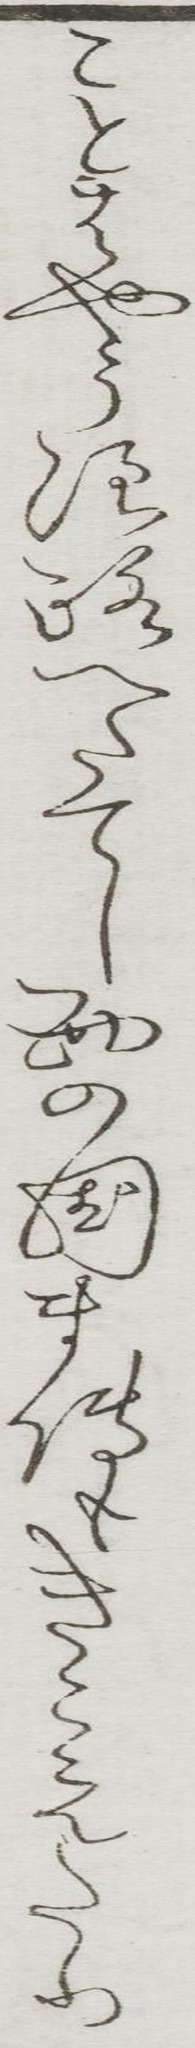ことはやう浪路へたてし西の国まてもきこえたり
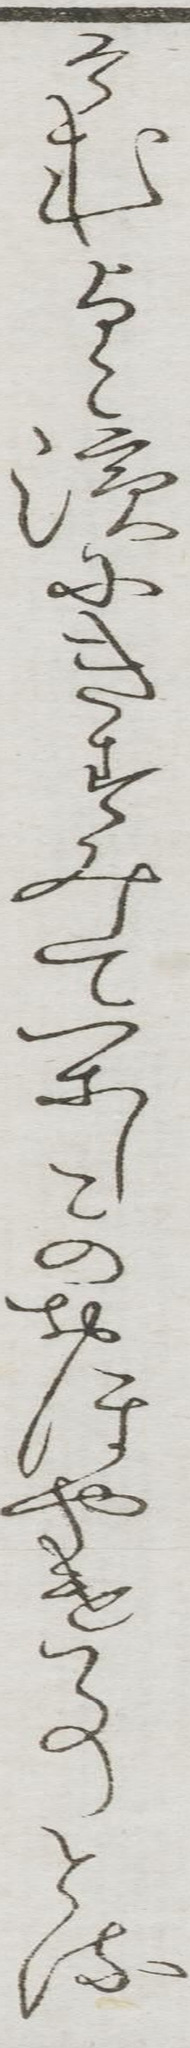けむよと浜にきすみてかしこのおほやけ事とる

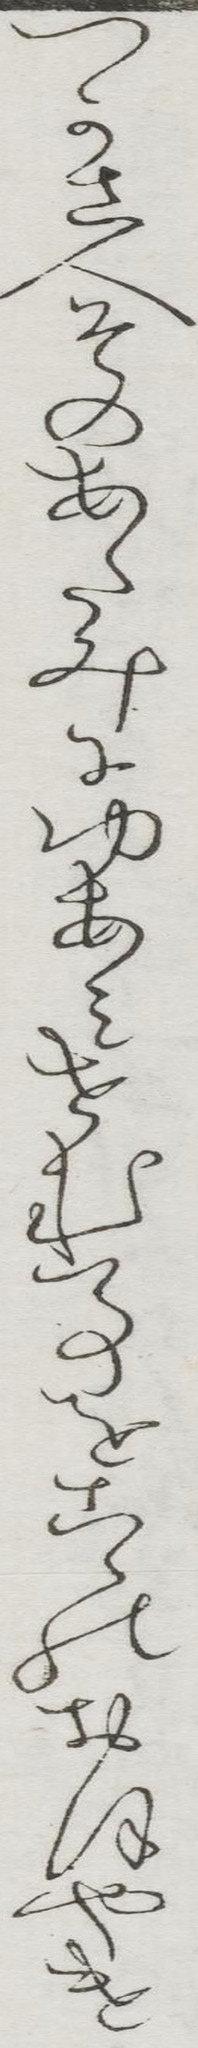つかさ人そのあたみにゆあみせむ事をこゝのおほやけ
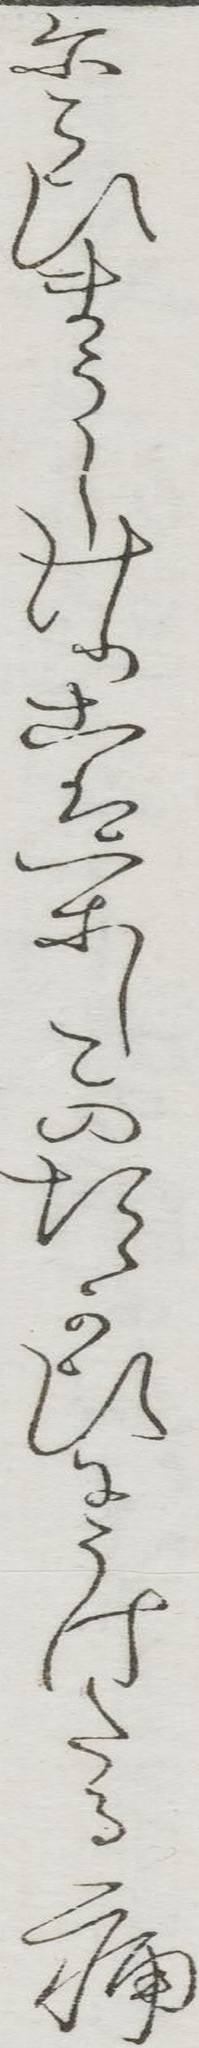にとひまうしけりこはかしこのたゝかひにうけたる痛
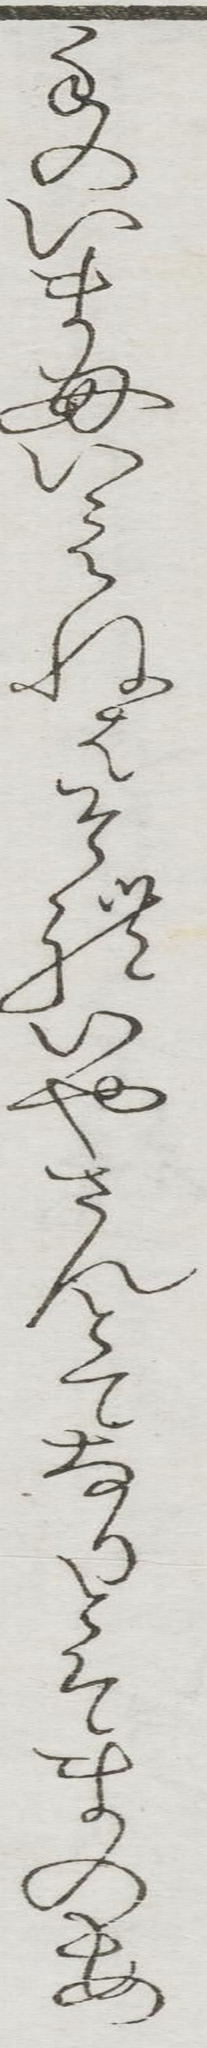手のいまもいえねはそれいやさんとてなりとそまのあ
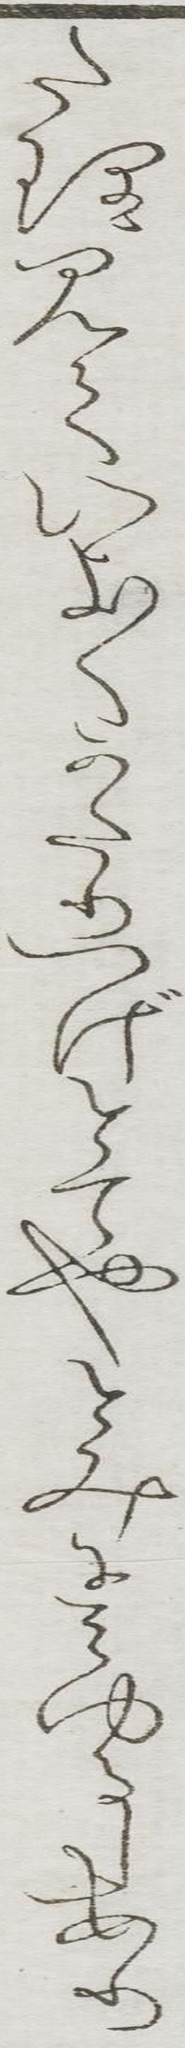たり見ていよ〳〵かたりつげとてやとみにみゆるしあり
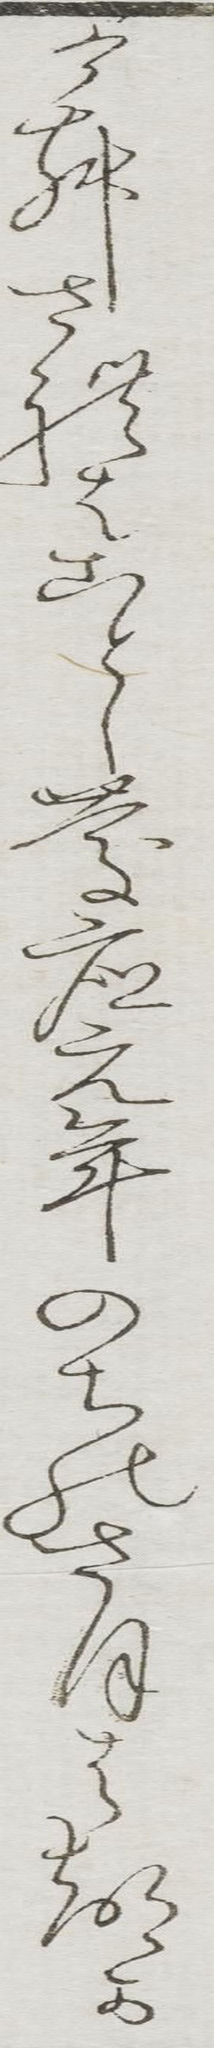けむされはことし慶応元年のちのさ月はつか
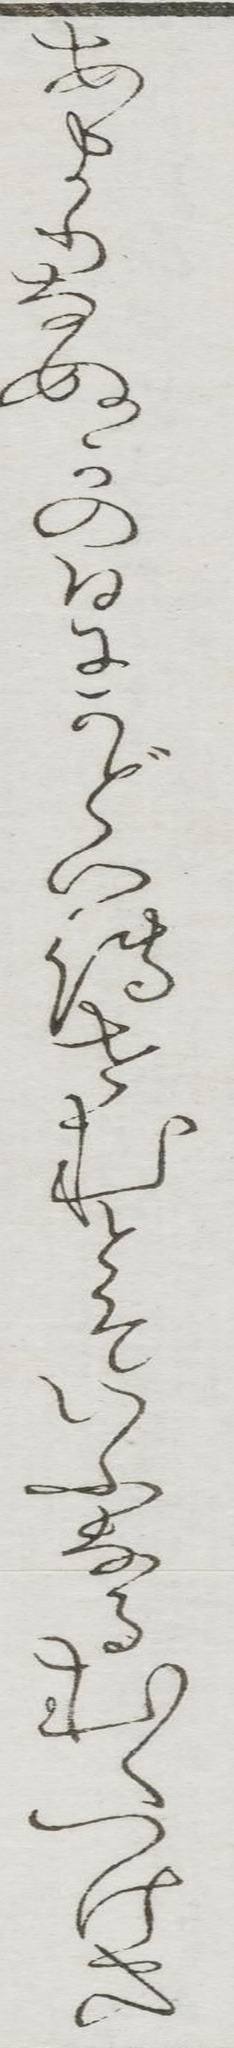あまりなぬかの日にかどいてせむとそいふなるむくつけき
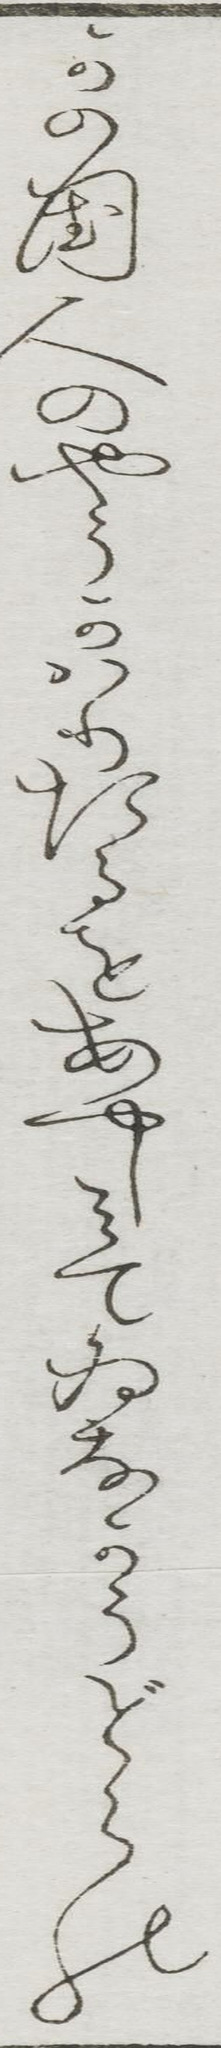かの国人のやうかはりたるをあやしみてゐなかうどらの
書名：挿画熱海日記　全
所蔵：東京大学地震研究所図書室 Earthquake Research Institute Library, The University of Tokyo, JAPAN
